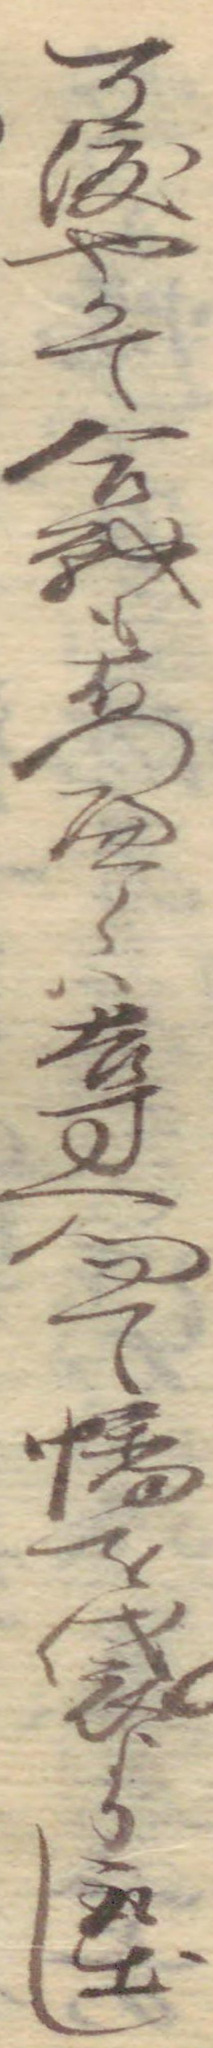可渡やかて合戦も有つへくハ吉方へ向て幡を袋より取出し
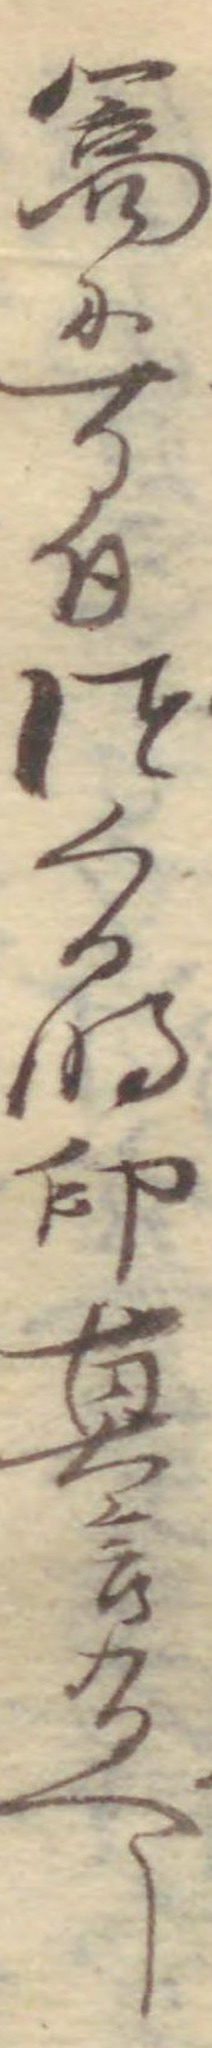篙幡に可付つくる時印真言有へし
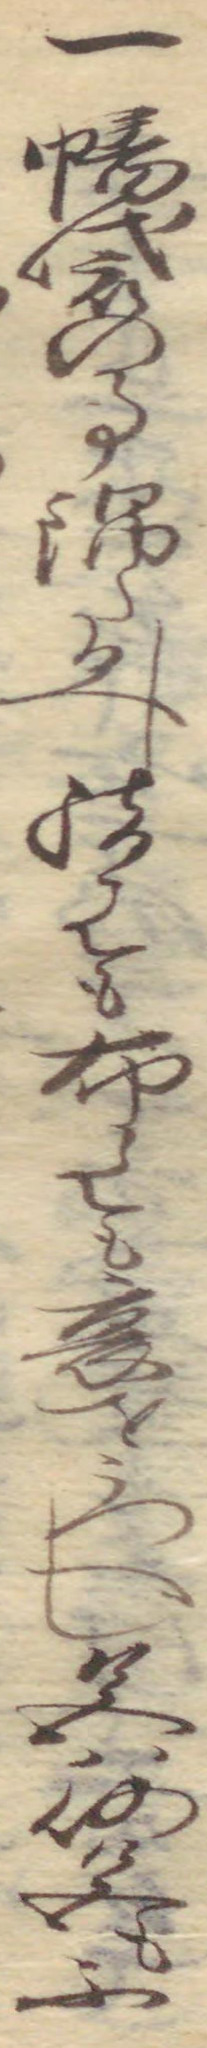一幡袋の事錦たるへし絹ニても布ニても裏をうつへし色ハ何色も不
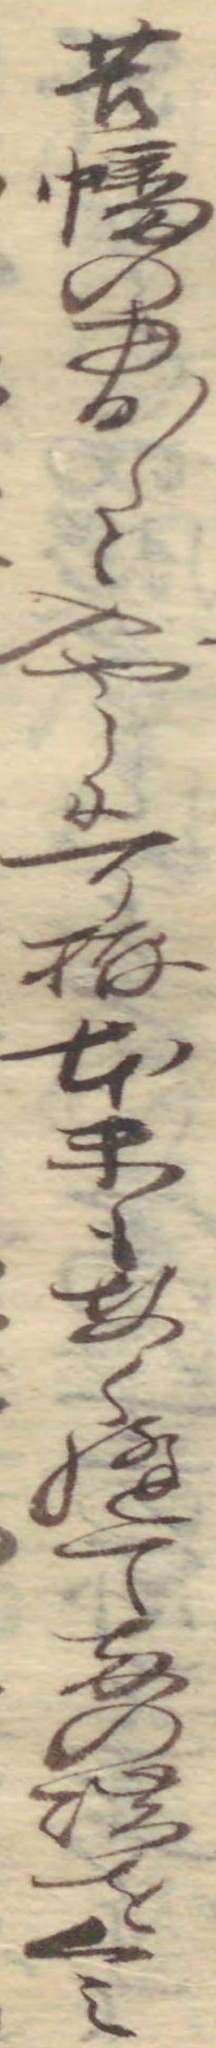苦幡のゆる〳〵と入やうに可拵本末もなく縫て両の端をくミ
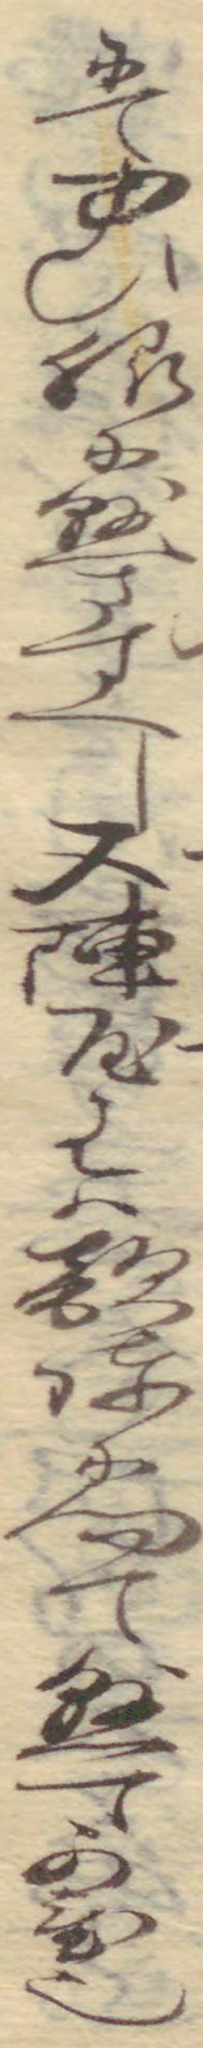ニてゆひ脇に懸さすへし又陣屋ニてハ敵陣に向て懸て可置也
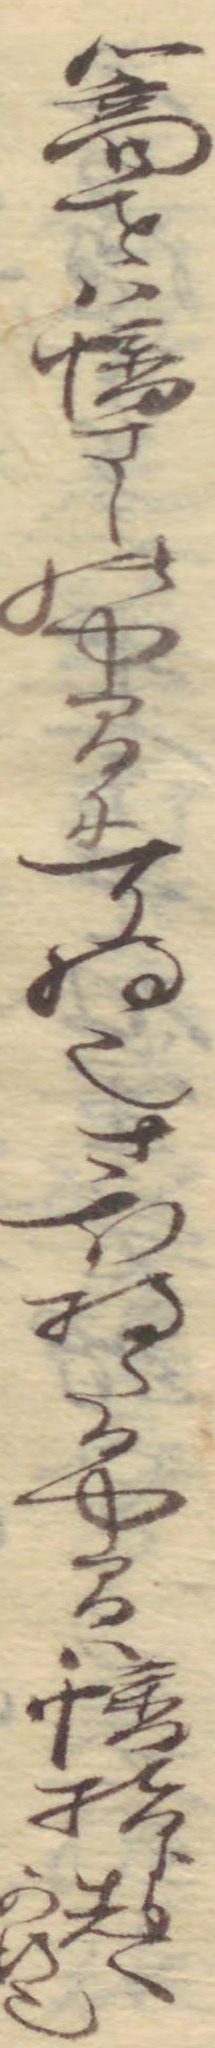篙をハ幡さしの中間に可持也さほ持たる中間ハ幡指より先へ可行也
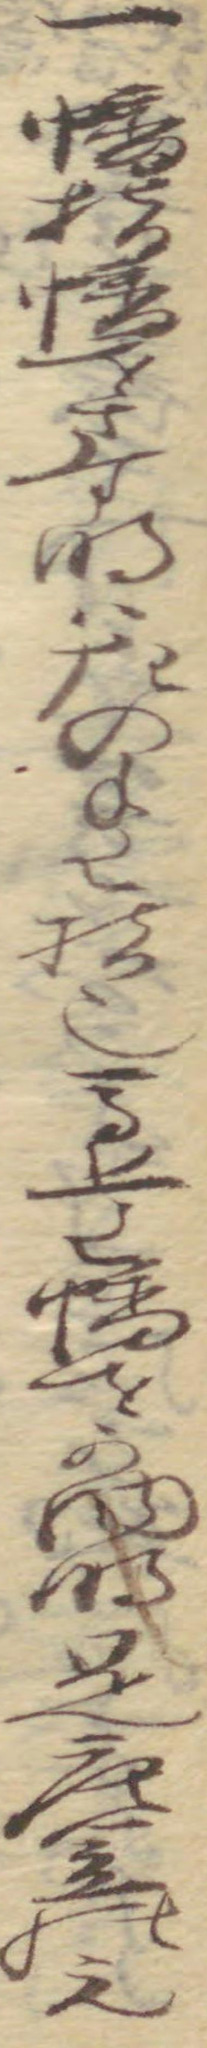一幡指幡をさす時ハ左の手ニて指也馬上ニて幡を可納時是唐笠のえ
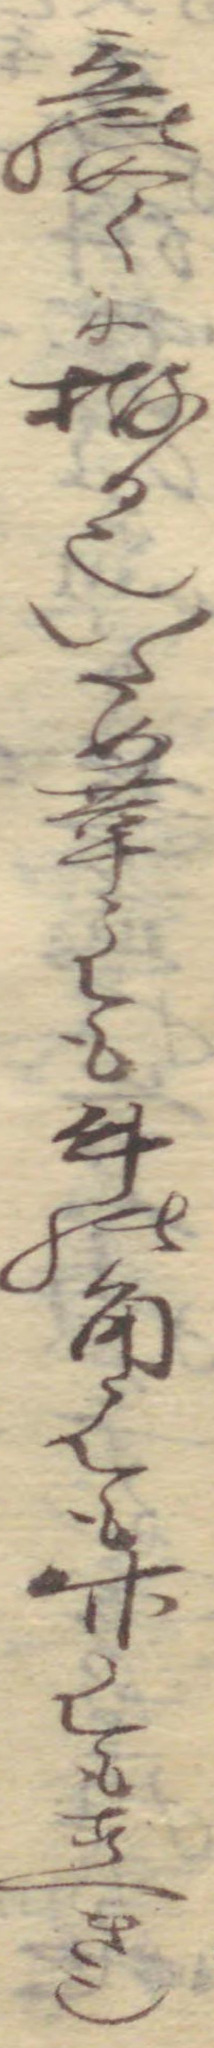立の如くに拵る也いため革ニても牛の角ニても竹ニてもすへき也
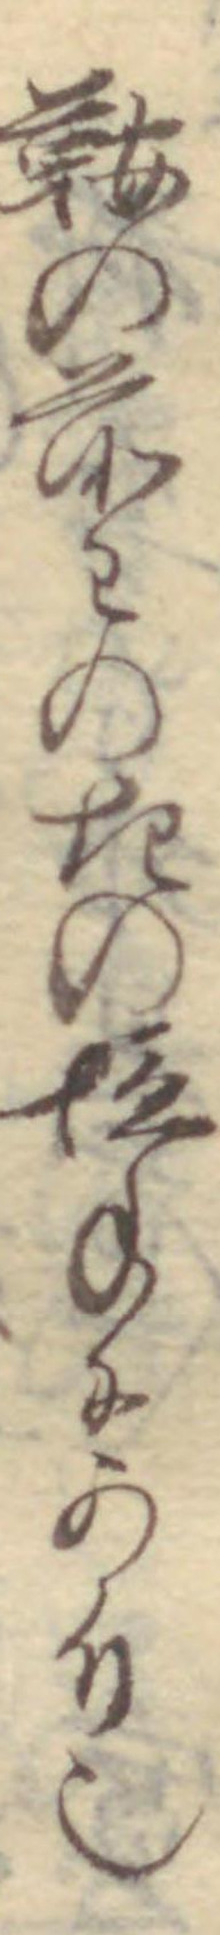鞍の前わの左の塩手に可付也
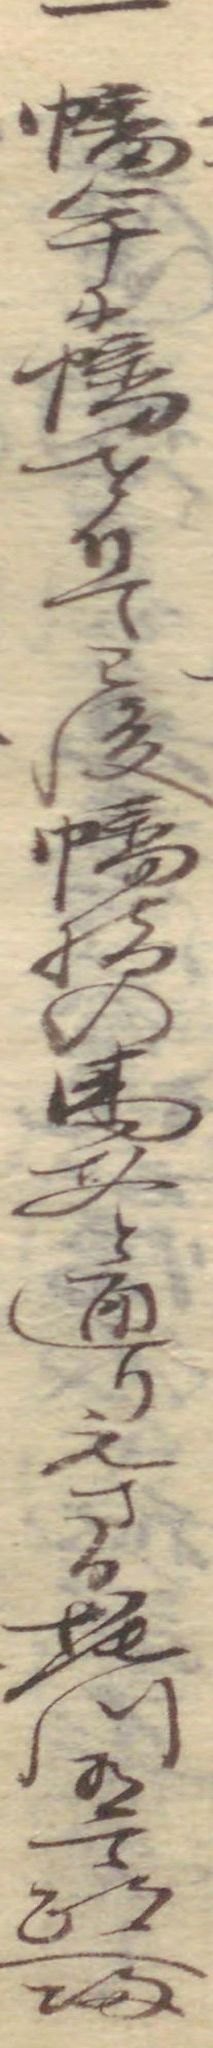一幡竿に幡を付て已後幡指の馬なと通りえさる堀川有て跡へ帰
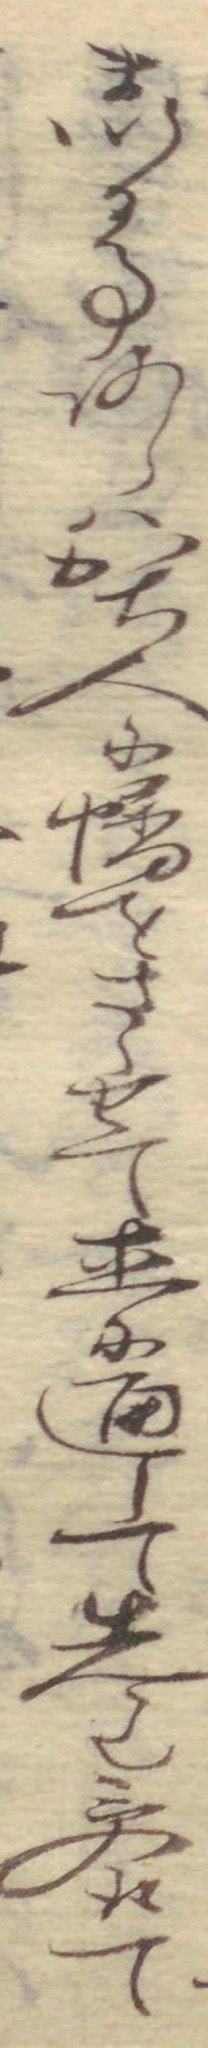まいる事あらハかち人に幡をさゝせて直に通して先ニて受取て
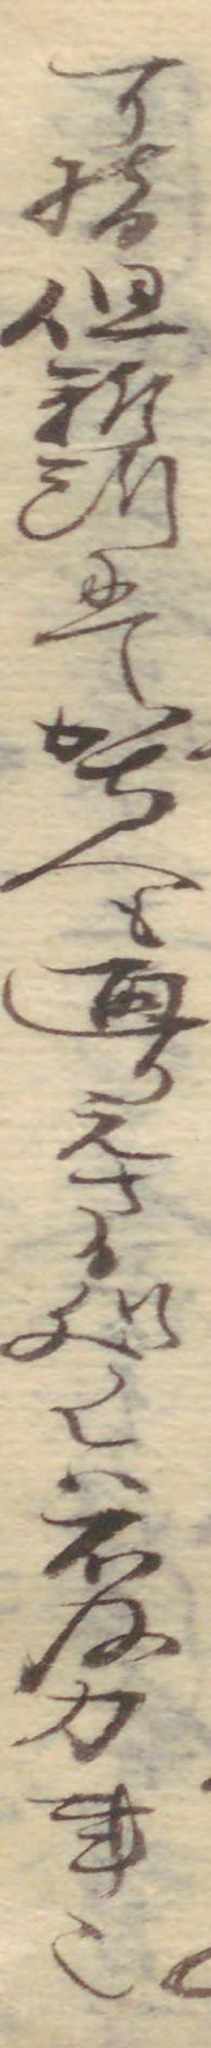可指但難所にてかち人も通りえさる処ニては不及力事也
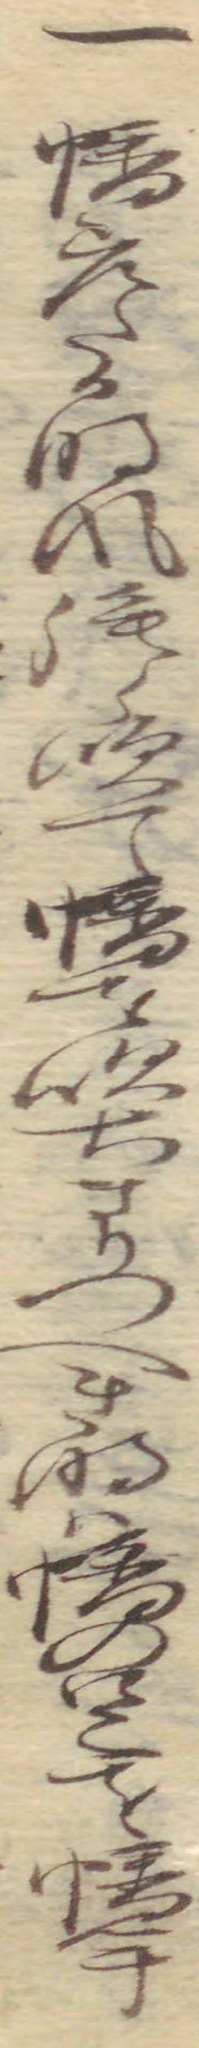一幡差たる時風強く吹て幡を吹ちきりつへき時ハ幡の足を幡竿
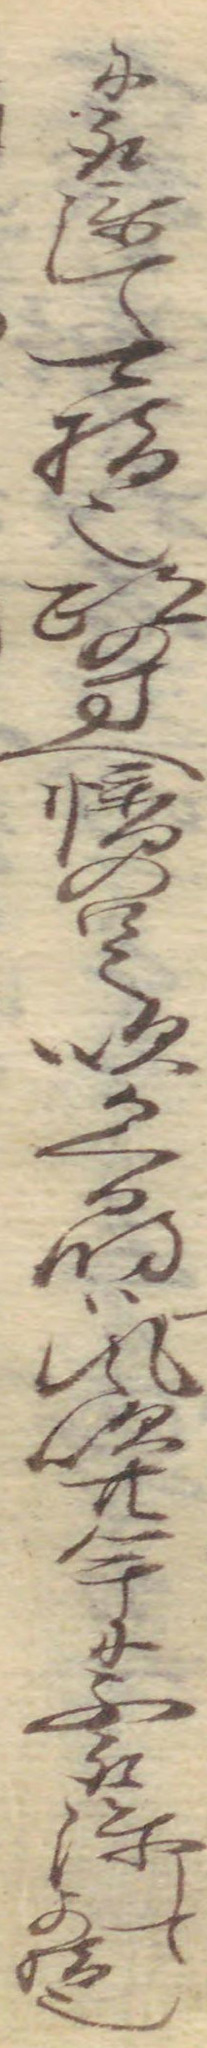に取添て可指也跡の方へ幡の足吹かくる時はハ風吹共竿に不取添して可指也
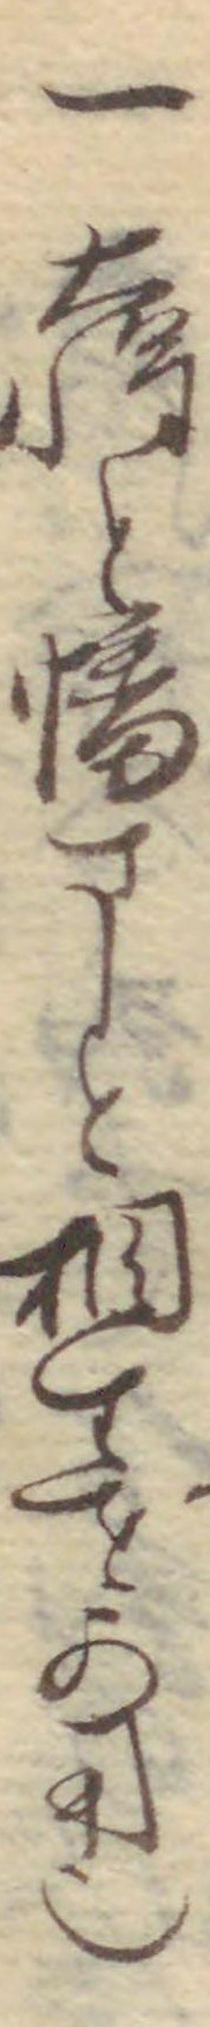一大将と幡さしと相生を可用也
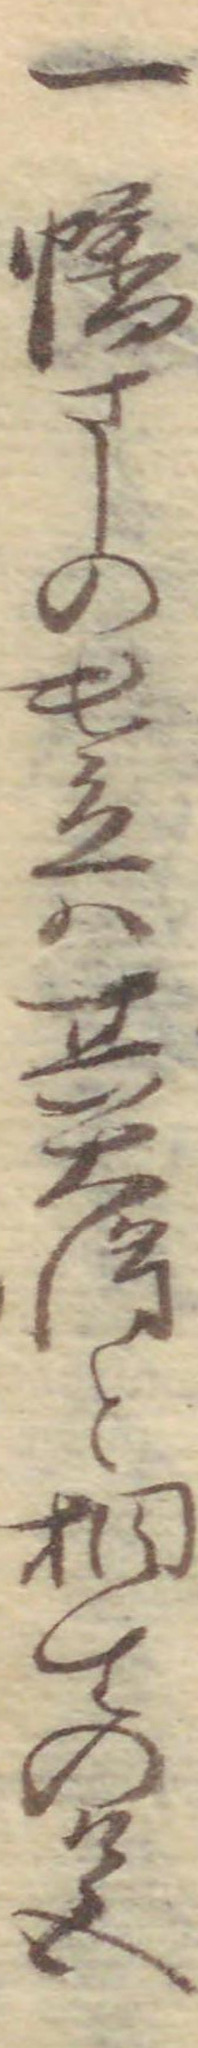一幡さしの出立ハ其大将と相生の色
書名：鶯宿雑記. 巻199-200
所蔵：国立国会図書館 National Diet Library, JAPAN
